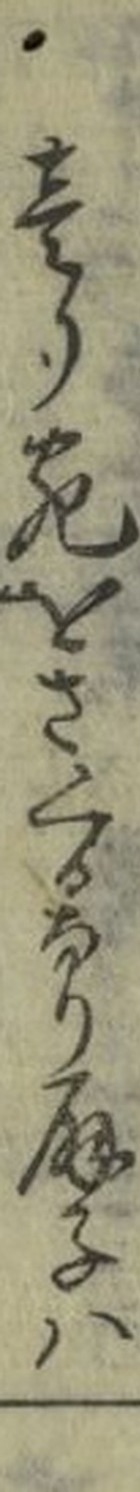壱つ宛をさくるなり扇子は
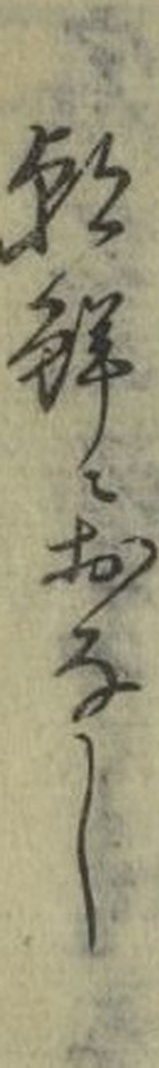朝鮮におなし
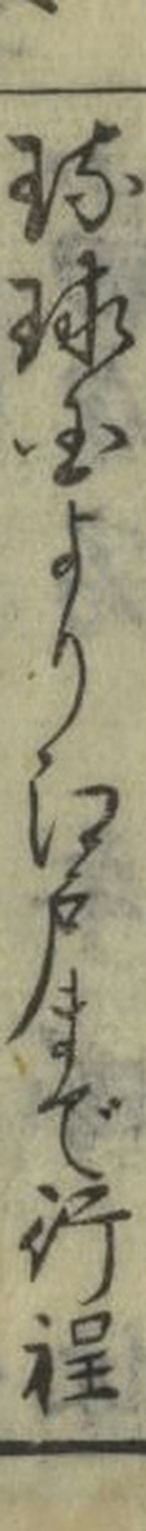琉球国より江戸まで行程
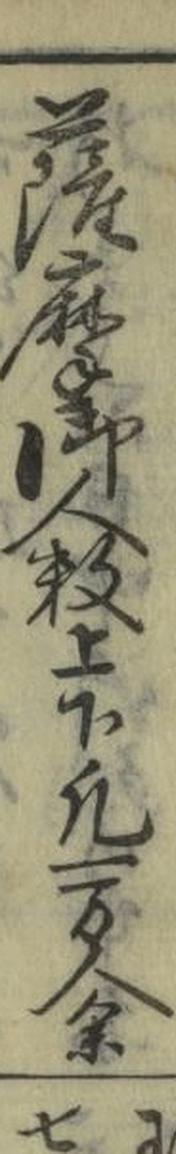薩摩御人数上下凡一万人余
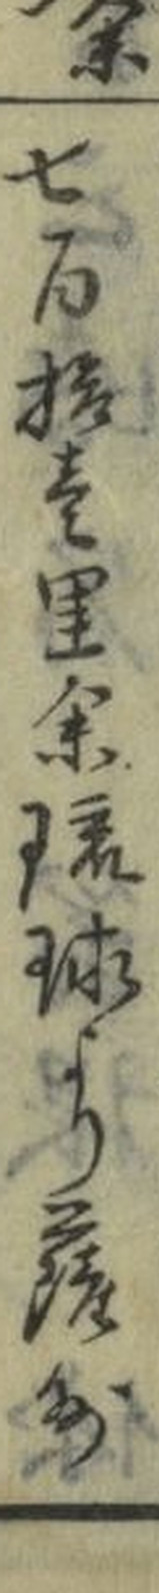七百拾壱里余琉球より薩州
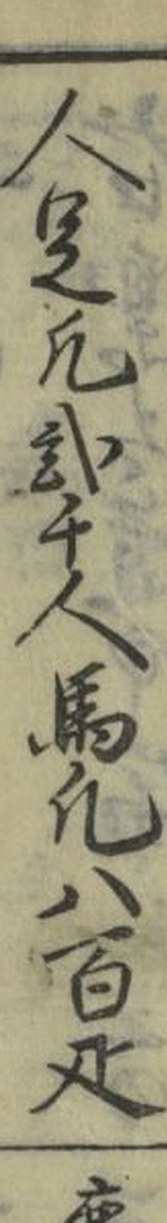人足凡弐千人馬凡八百疋
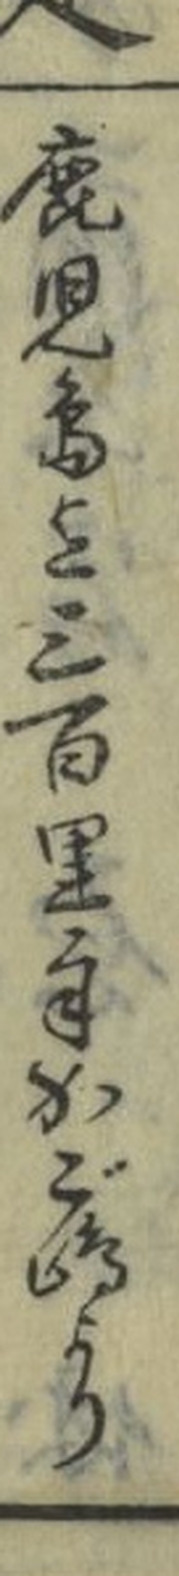鹿児島迄三百里余かご嶋より
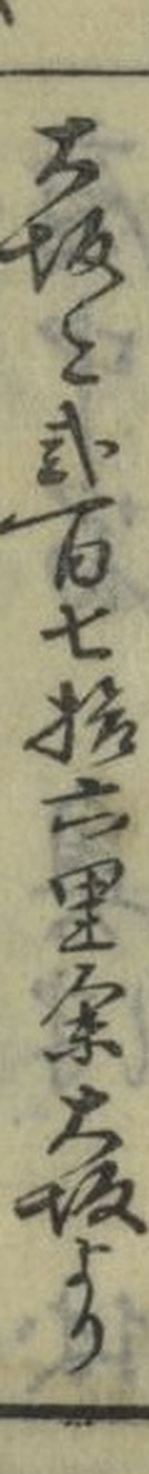大坂迄二百七拾六里余大坂より
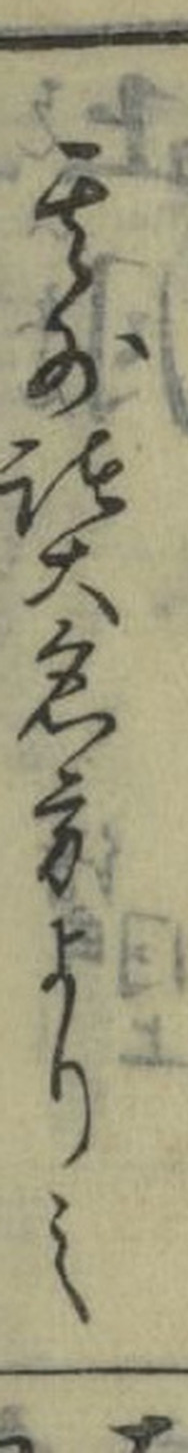其外諸大名方より之
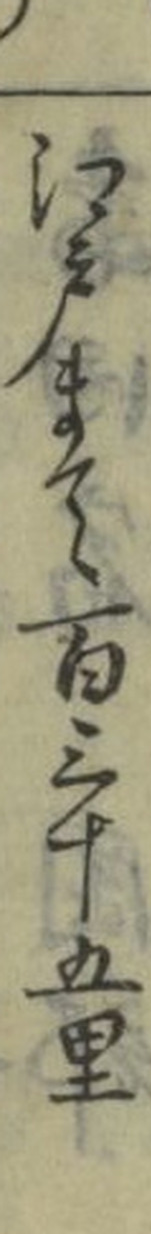江戸まて百三十五里
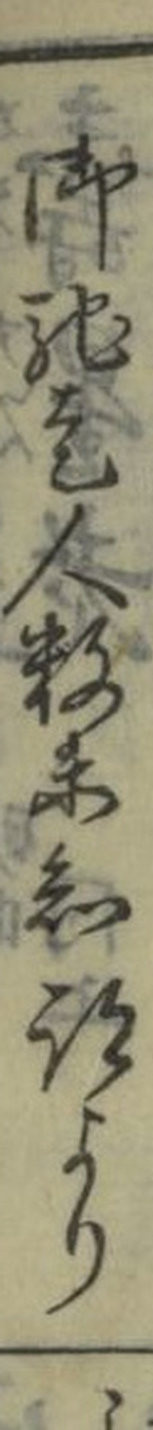御馳走人数未知跡より
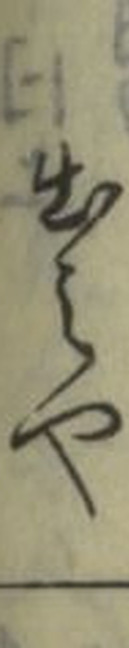出之也
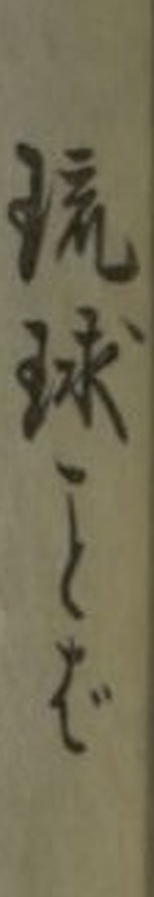琉球ことば
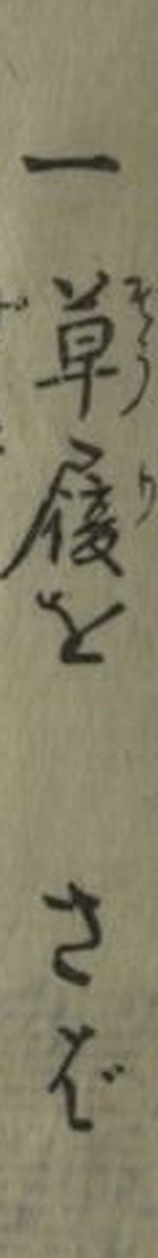一草履をさば
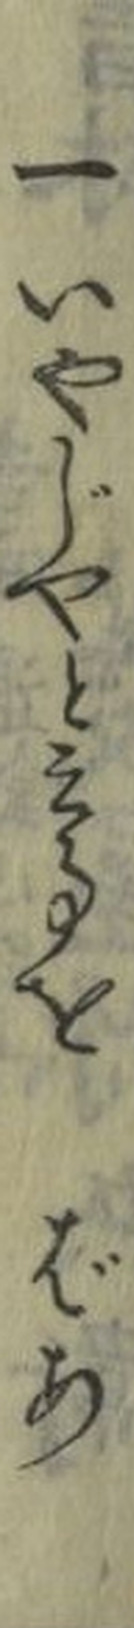一いやじやと云事をばあ
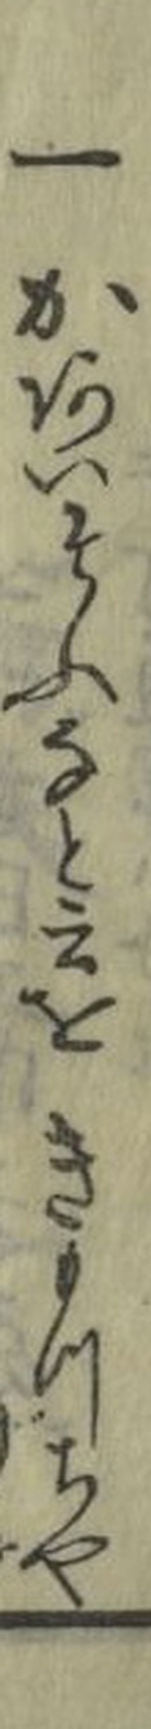一かあいそふなと云をきもつちやげな
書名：新板 琉球人行列記
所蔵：University of the Ryukyus Library
